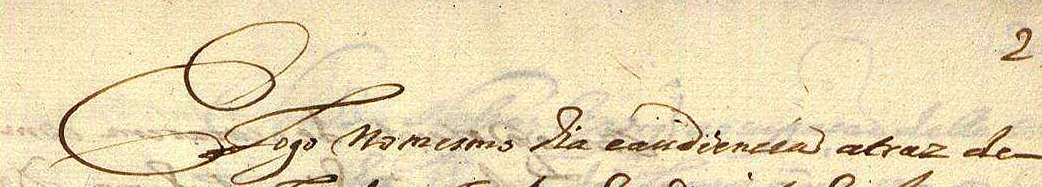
E Logo no mesmo dia e audiencia atraz de
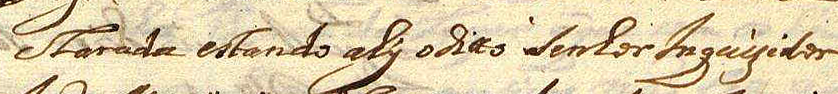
clarada estando ahy o ditto Senhor Inquisidor
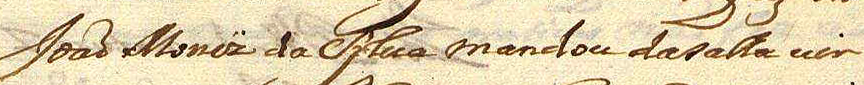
Joaõ Moniz da Sylua mandou da salla uir
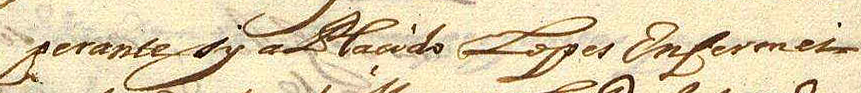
perante sy a Placido Lopes Enfermei
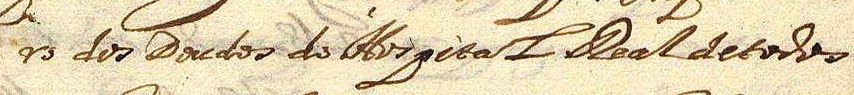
ro dos Doudos do HospitaL Real de todos
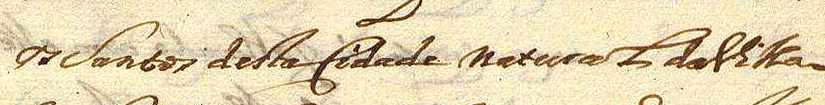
os Santos desta Cidade naturaL da Villa
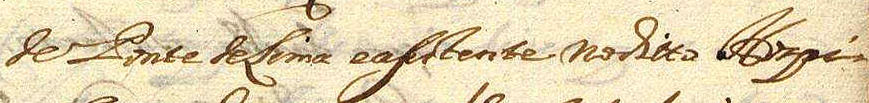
de Ponte de Lima e assitente no ditto Hospi
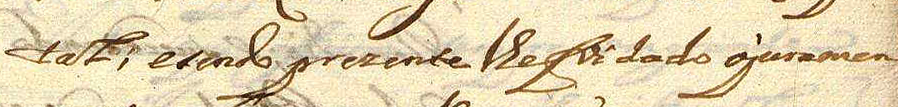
taL, e sendo prezente lhe foi dado o juramen
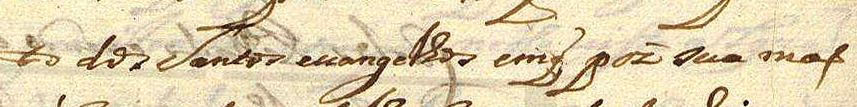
to dos Santos euangelhos em q̄ poz sua maõ
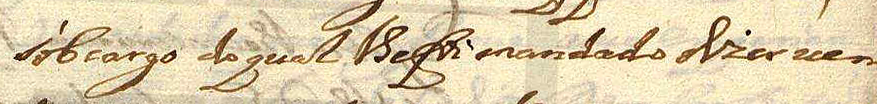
sob cargo do qual lhe foi mandado dizer uer
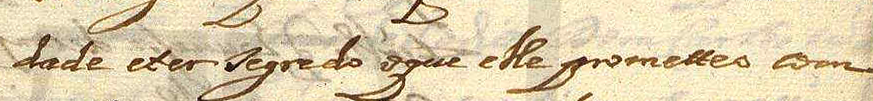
dade e ter segredo o que elle prometteo com
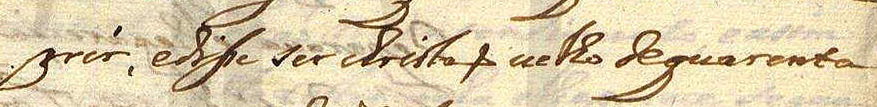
prir, e disse ser christaõ uelho de quarenta
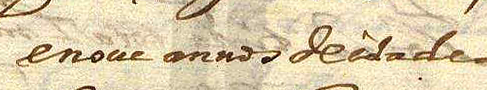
e noue annos de idade
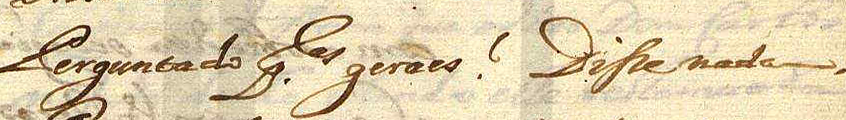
Perguntado p.las geraes? Disse nada
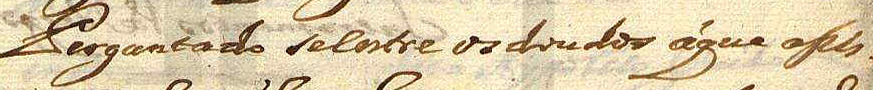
Perguntado se entre os doudos á que assis
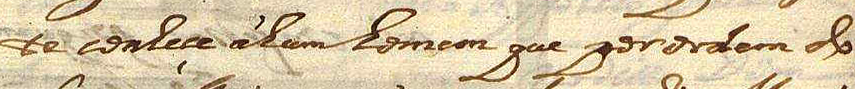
te conhece á hum homem que por ordem do
